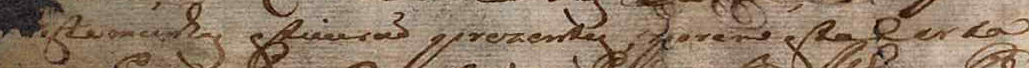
testemunhaz estiueraõ prezentes porem esta Certa
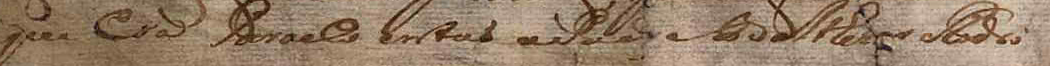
que Era Parocho entaõ o Padre Balthe_ Rodri
